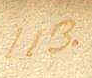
113.
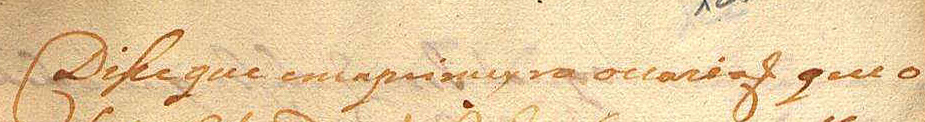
Disse que em a primeyra occaziaõ que o
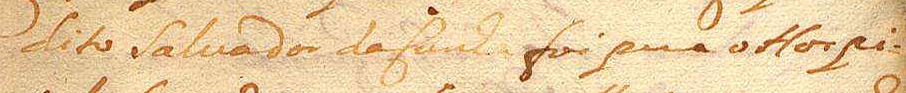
dito Saluador da Cunha foi pera o Hospi
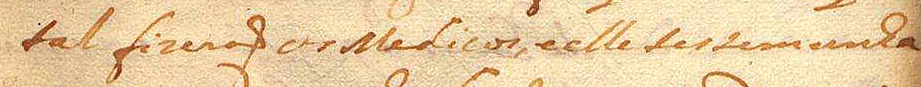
tal fizeraõ os Medicos, e elle testemunha
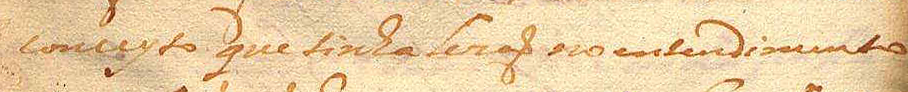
conceyto que tinha lezaõ no entendimento
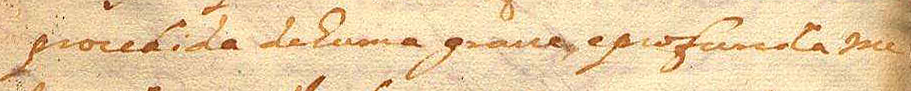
procedida de huma graue, e profunda me
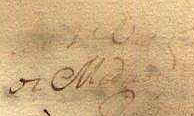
os Medicos
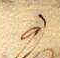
q̄
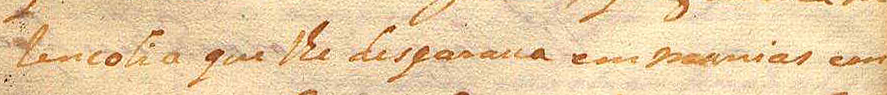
lancolia que lhe desparaua em manias em
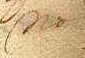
no
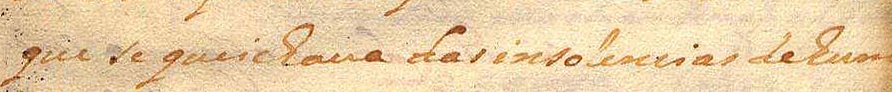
que se queichava das insolencias de hum
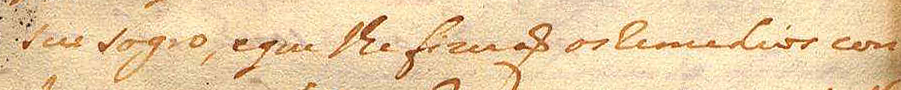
seu sogro, e que lhe fizeraõ os Remedios con
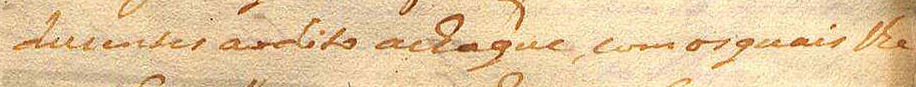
ducentes ao dito achaque, com os quais lhe
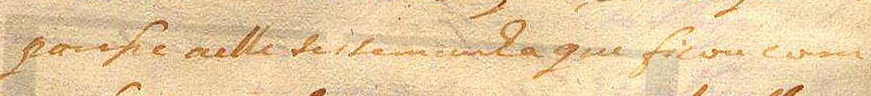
paresse a elle testemunha que ficou com
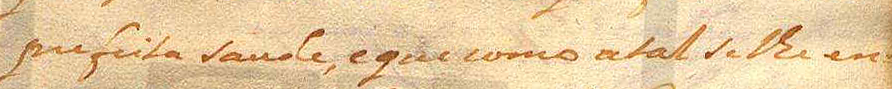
prefeita saude, e que como a tal se lhe en
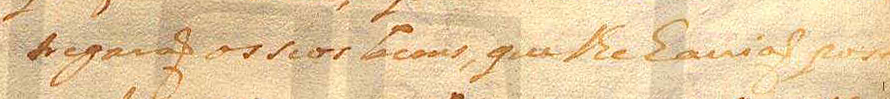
tregaraõ os seos bens, que lhe hauiaõ posto
